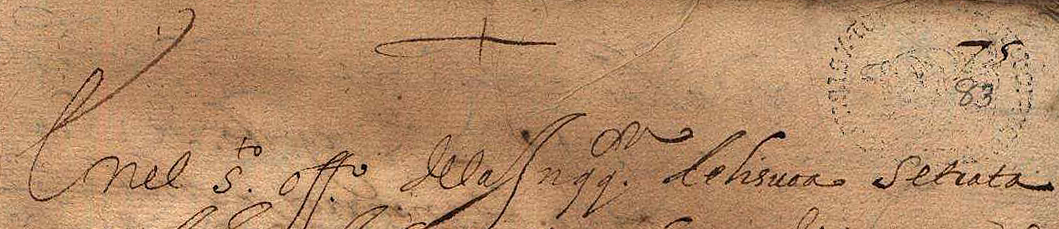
En el s.to off.o de la Jnqq.on de lisuoa se trata
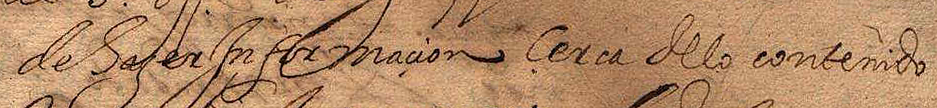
de hazer Jnformacion cerca de lo contenido
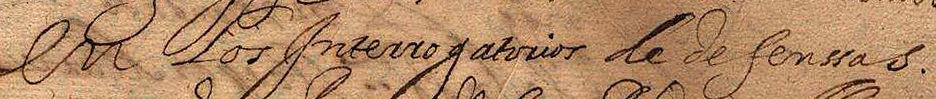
en Los Jnterrogatorios de defenssas
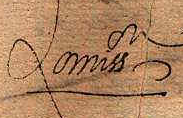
Comisson
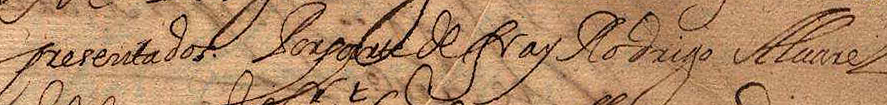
presentados. Por parte de fray Rodrigo AluareZ
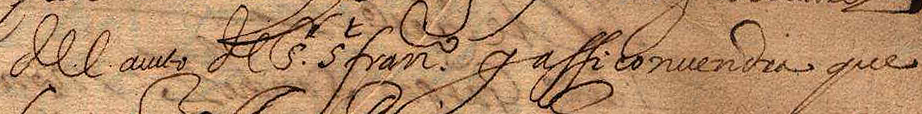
del auto de s.r st fran.co y assi conuendia que
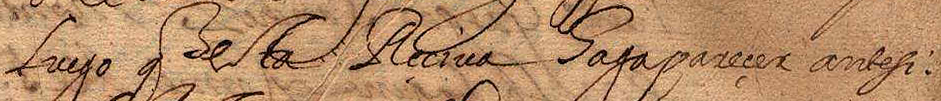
luego q̄ esta Reciua haga parecer ante si
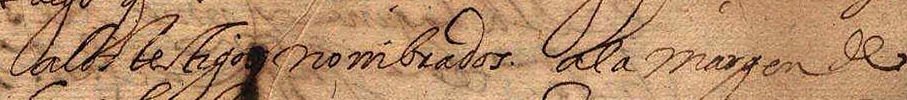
a los testigos nombrados e la margen de
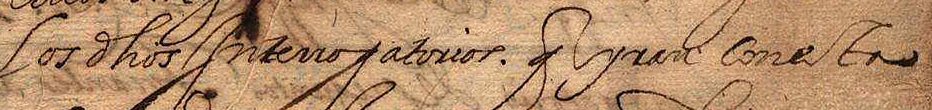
los ohos Jnterrogatorios q̄ yran con esta
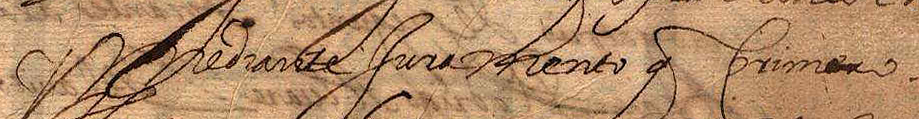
y mediante Juramento q̄ primero
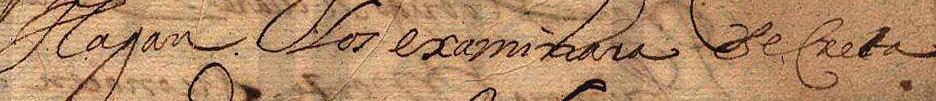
Hagan los examinara seCreta
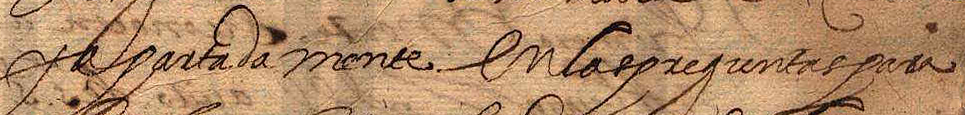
y apartadamente en las preguntas para
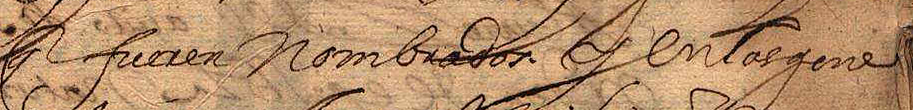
q̄ fueren nombrados y en las gene
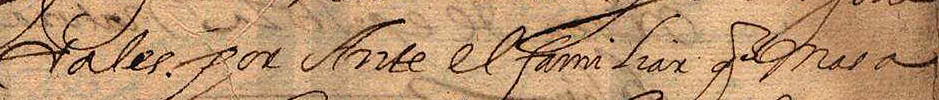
rales por Ante el familiar q̄ mas a
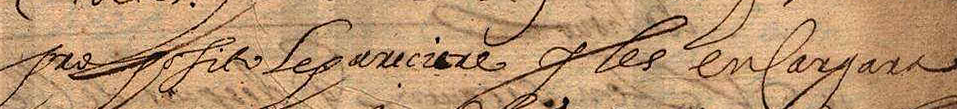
proposito le pareciere y les enCargara
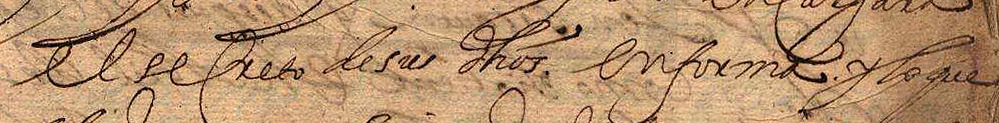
el seCreto de sus dhōs en forma y lo que
